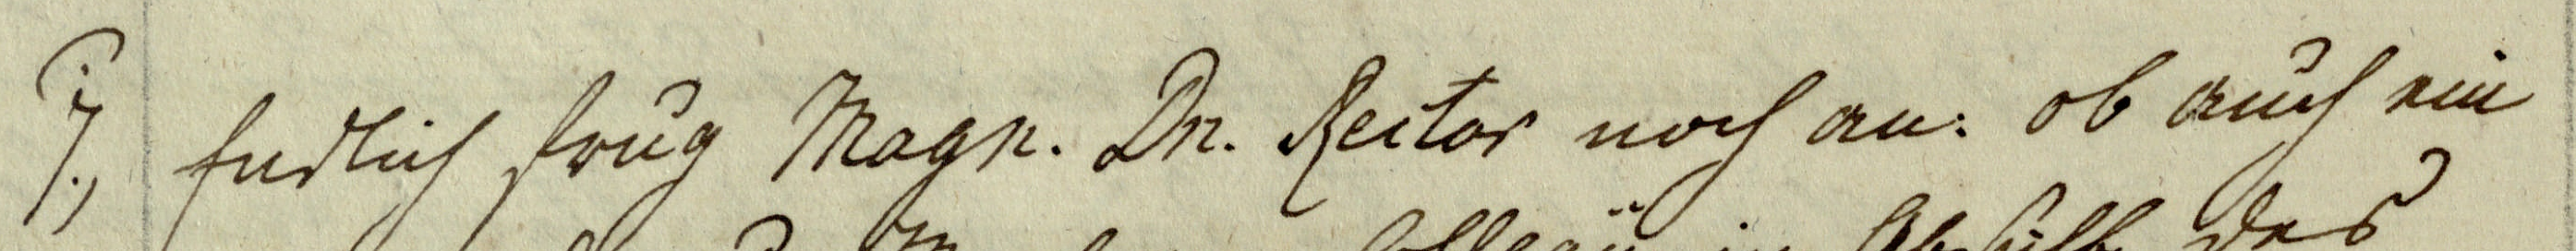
7., Endlich frug Magn. Dn. Rector noch an: ob auch ein
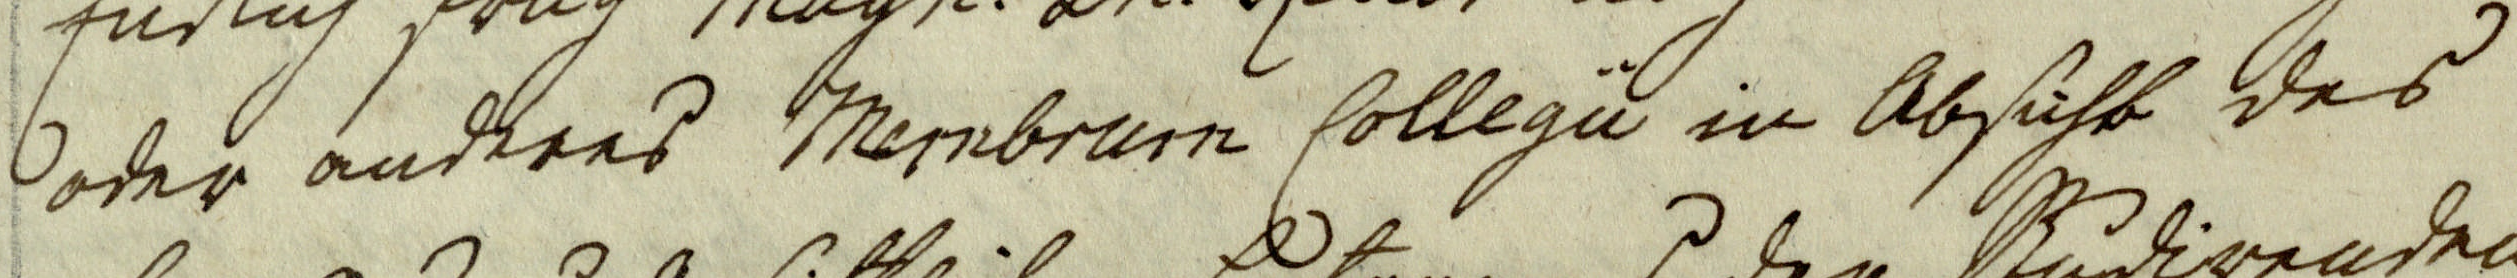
oder anderes Membrum Collegii in Absicht des
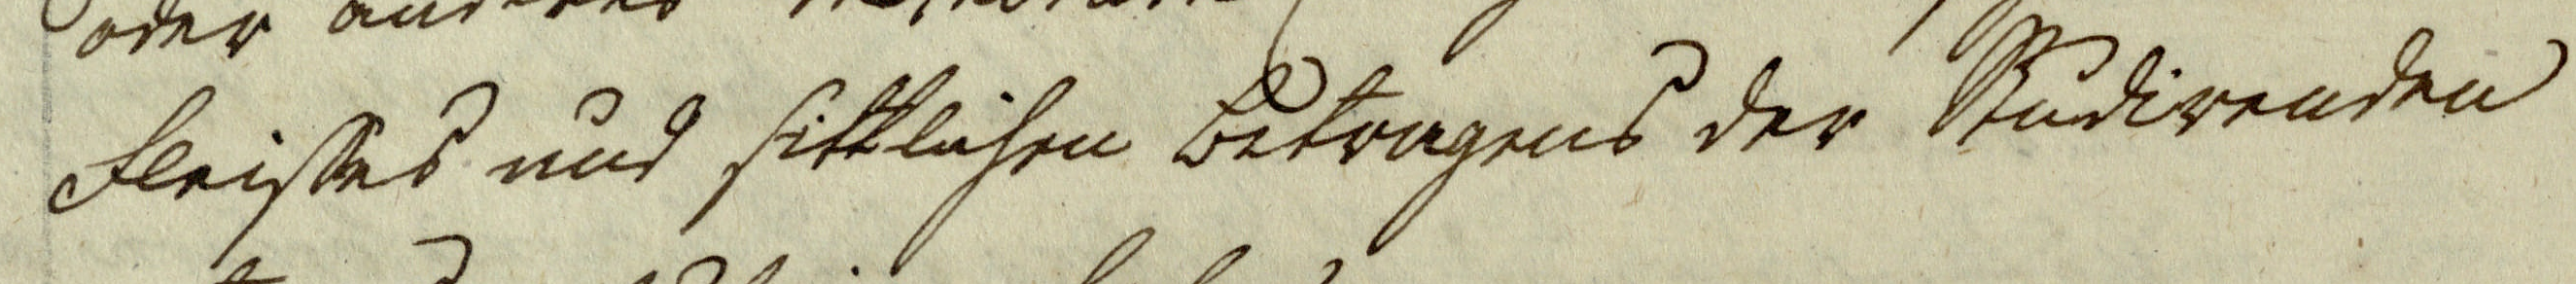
Fleisses und sittlichen Betragens der Studirenden
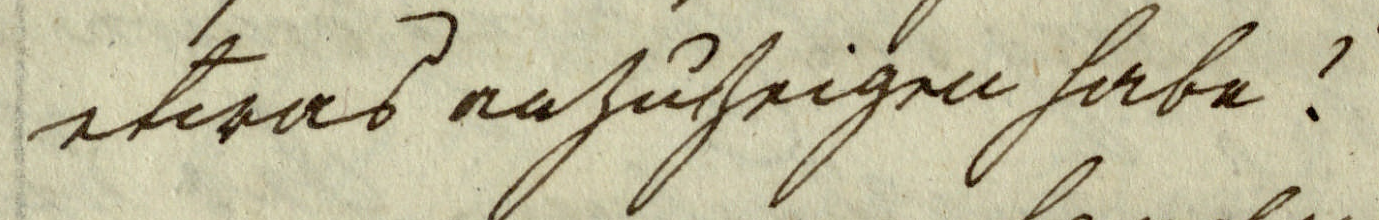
etwas anzuzeigen habe?
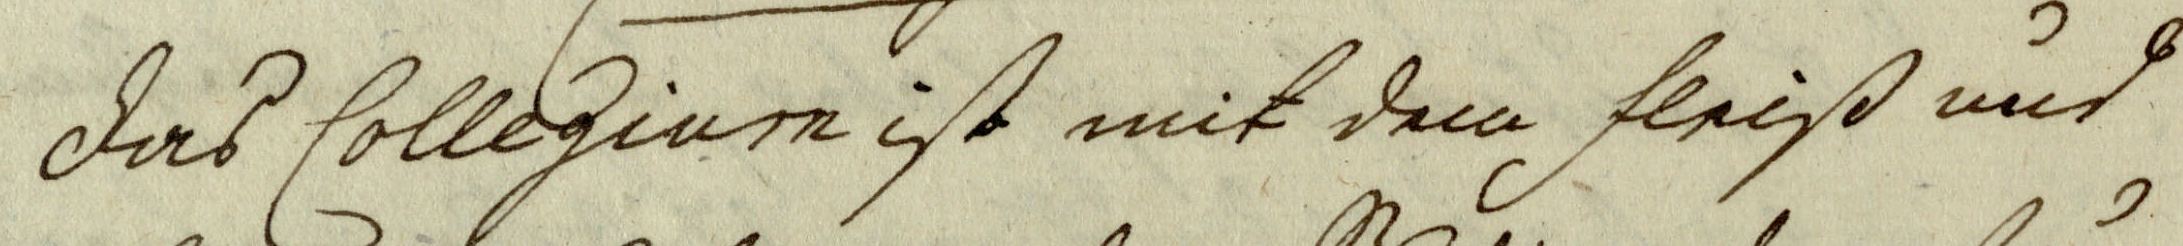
Das Collegium ist mit dem Fleiß und
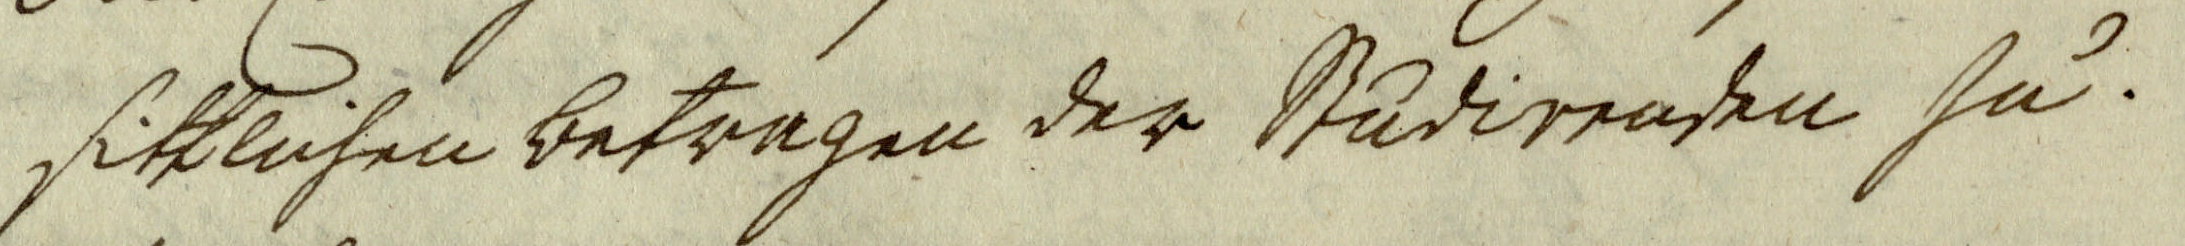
sittlichen Betragen der Studirenden zu¬
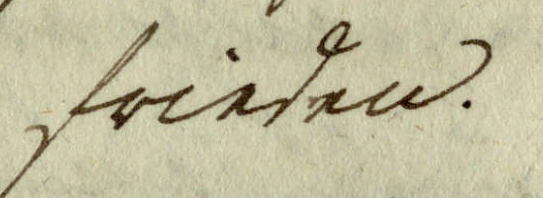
frieden.
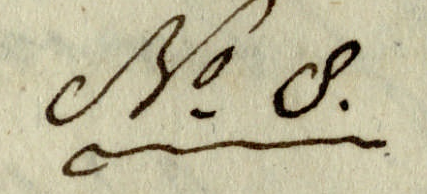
No 8.
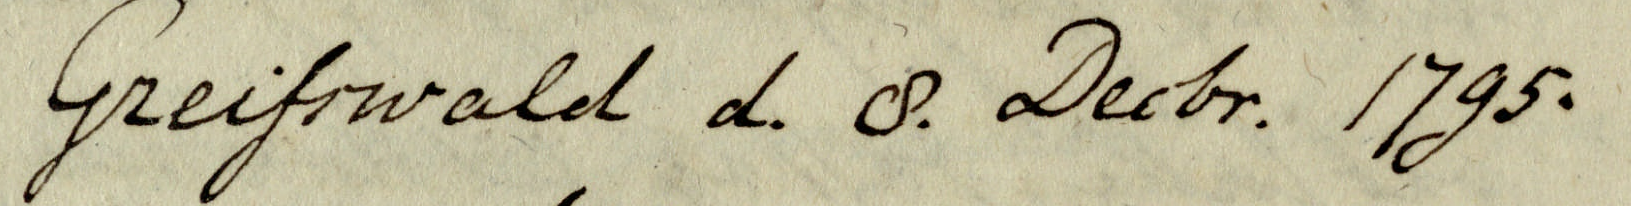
Greifswald d. 8. Decbr. 1795.
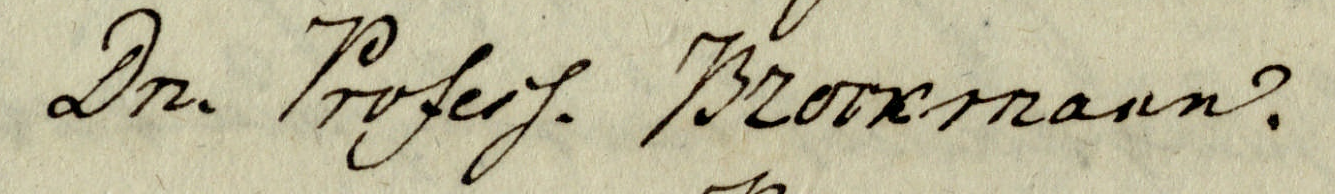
Dn. Profess. Brockmann.
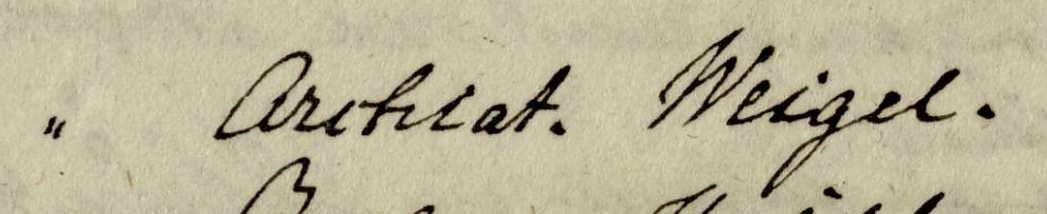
" Archiv. Weigel.
